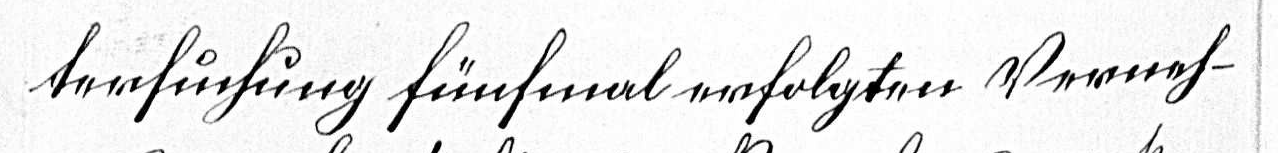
tersuchung fünfmal erfolgen Verneh¬
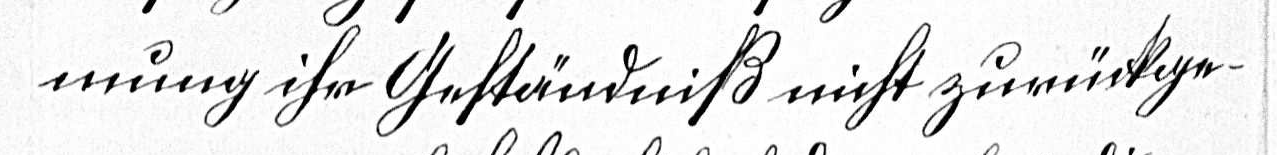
mung ihr Geständniß nicht zurückge¬
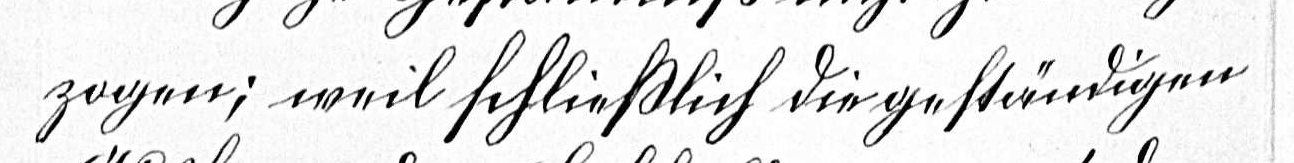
zogen; weil schließlich die geständigen
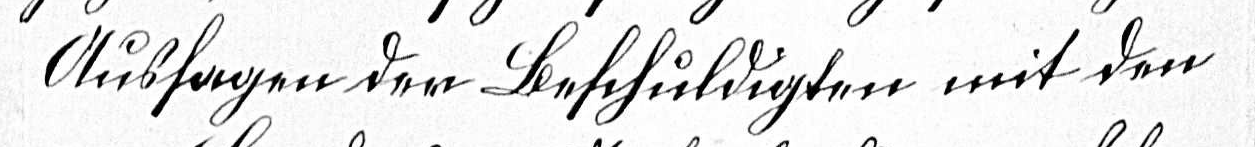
Aussagen der Beschuldigten mit den
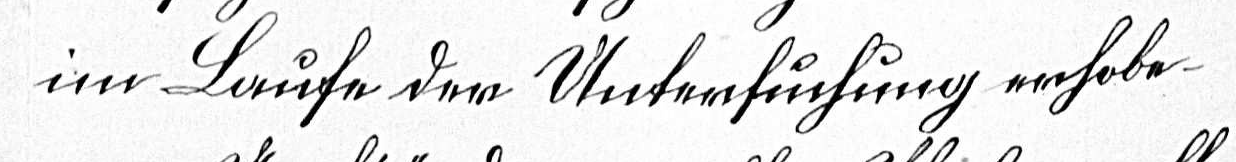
im Laufe der Untersuchung erhobe¬
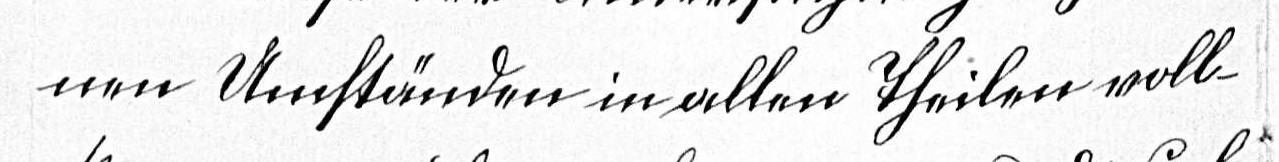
nen Umstände in allen Theilen voll¬
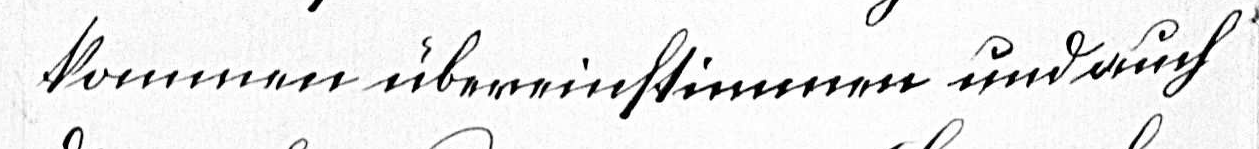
kommen übereinstimmen und auch
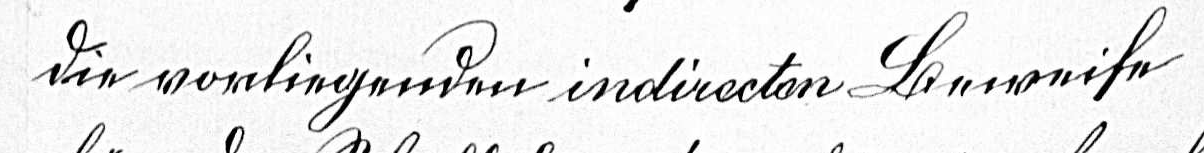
die vorliegenden indirecten Beweife
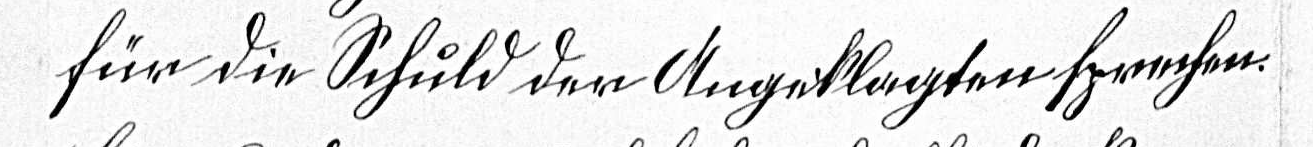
für die Schuld der Angeklagten sprechen.
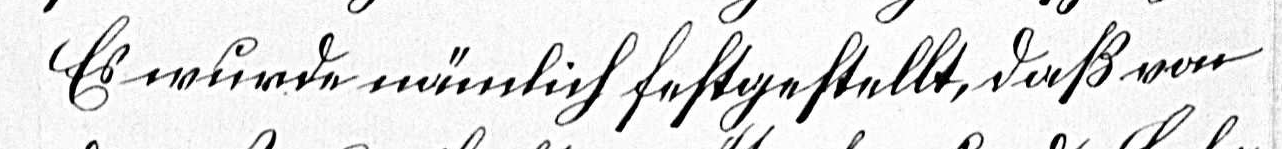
Es wurde nämlich festgestellt, daß von
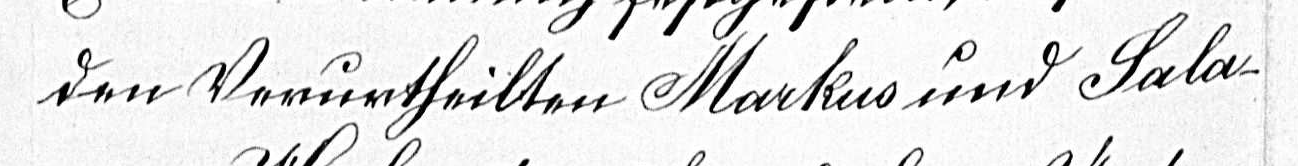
den Verurtheilten Markus und Sala¬
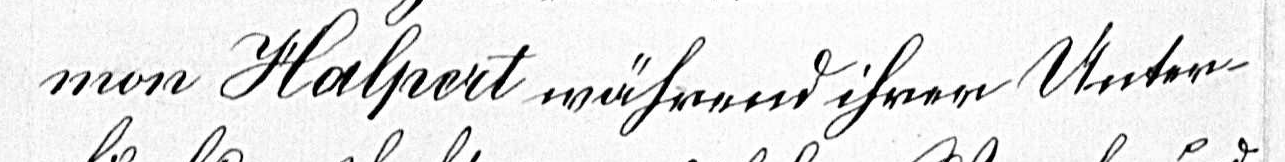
mon Halpert während ihrer Unter¬
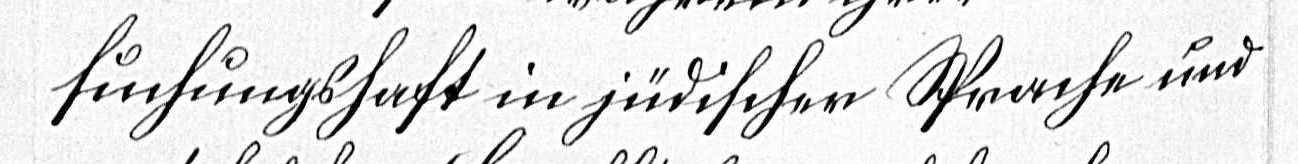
suchungshaft in jüdischer Sprache und
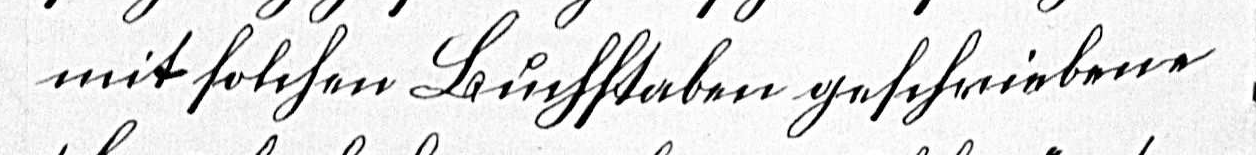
mit solchen Buchstaben geschriebene
